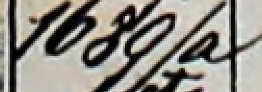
1689/a et
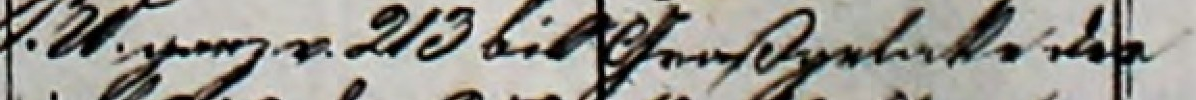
P.W ganz v. 213 bis Großgelake der
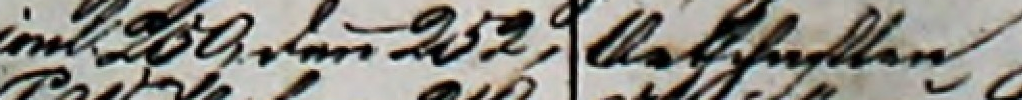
incl 250, dann 252, Rathschaften
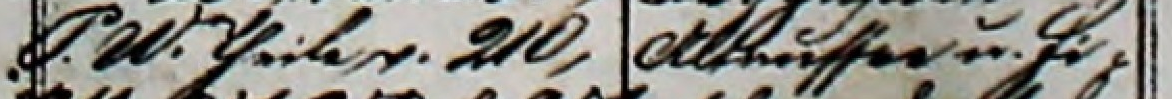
P.W. Theile v. 210, Altaussee u. Fi„
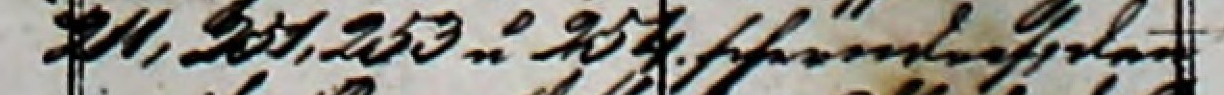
211, 251, 253 u 254. scherendorf, dann
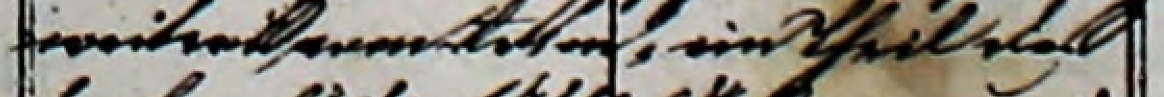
weiters ???„ ein Theil des
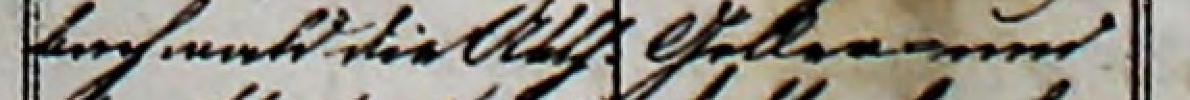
bachwald die Abth. Gell??? und
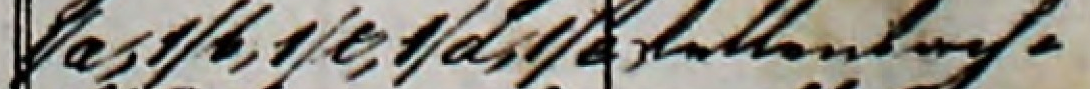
1/a, 1/b, 1/c, 1/d, 1/e Rettenbach„
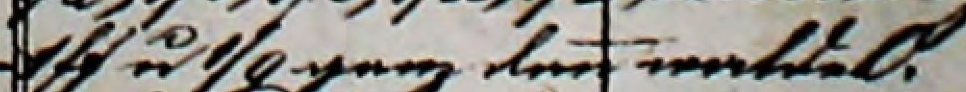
1/f y 1/g ganz dann waldes.
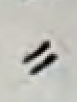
„
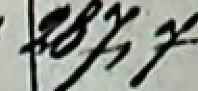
287,7
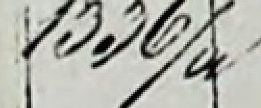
1336/a
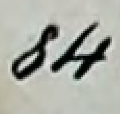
84
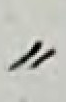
„
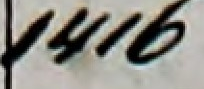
1416
